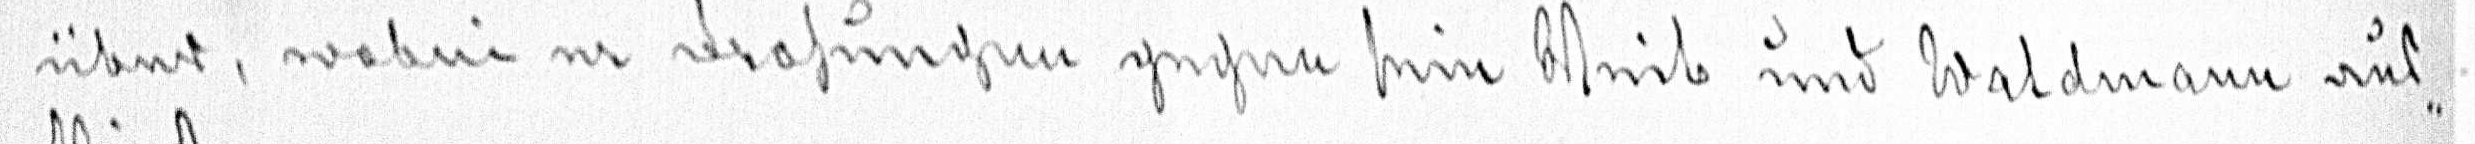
über, wobei er Drohungen gegen sein Weib und Waldmann aus¬
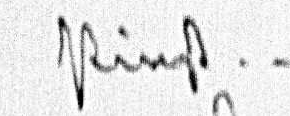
stieß.
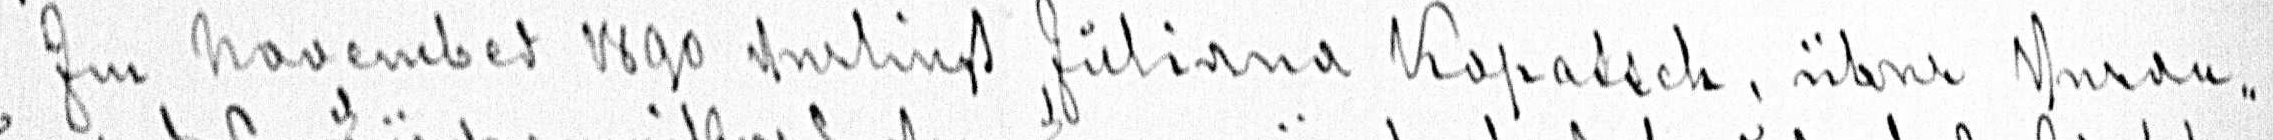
Im November 1890 verließ Jüliana Kopatsch, über Veran¬
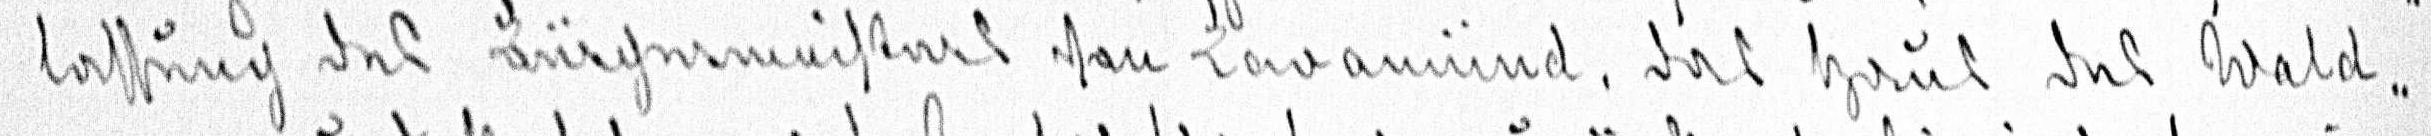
lassung des Bürgermeisters von Lavamünd, das Haus des Wald¬
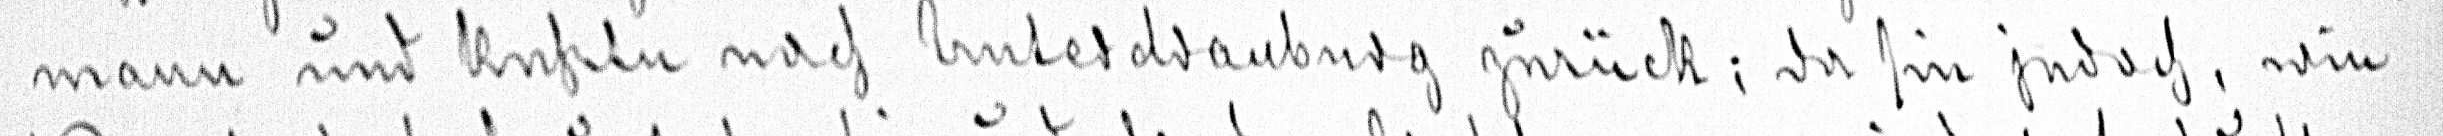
mann und kehrte nach Unterdrauburg zurück; da sie jedoch, wie
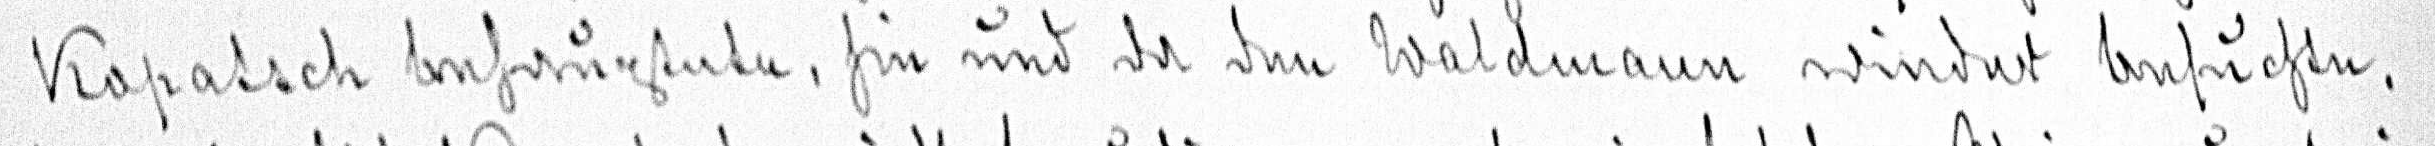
Kopatsch behauptete, hin und da den Waldmann wieder besuchte,
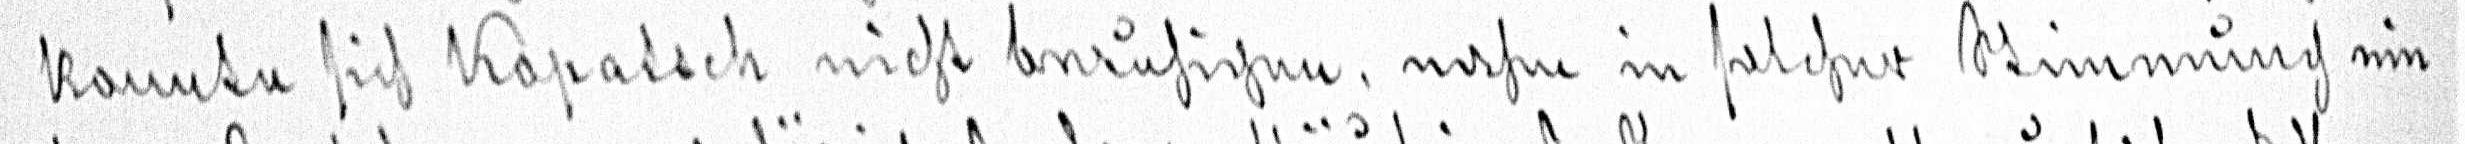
konnte sich Kopatsch nicht beruhigen, nahm in solcher Stimmung ein
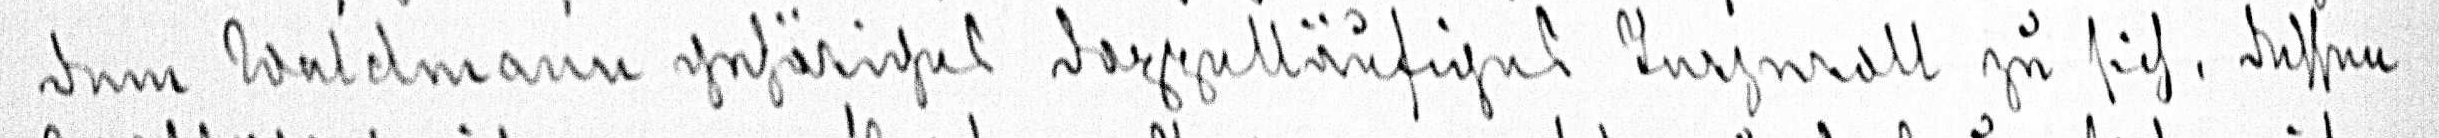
dem Waldmann gehöriges doppelläufiges Terzeroll zu sich, dessen
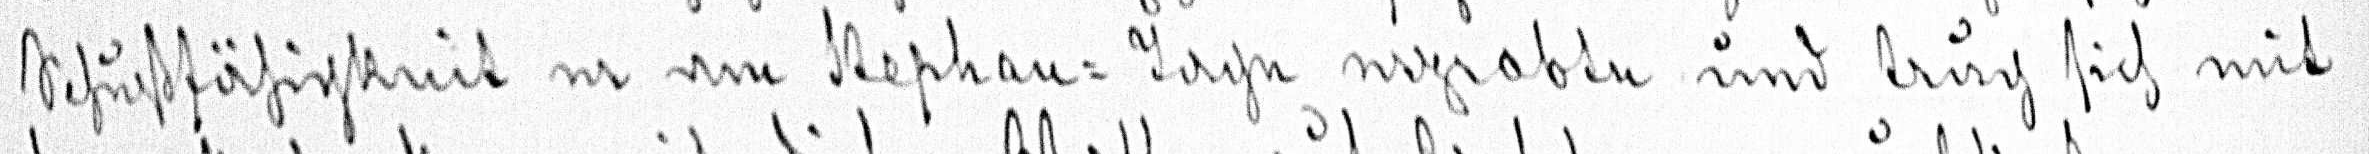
Schußfähigkeit er am Stephan-Tage erprobte und trug sich mit
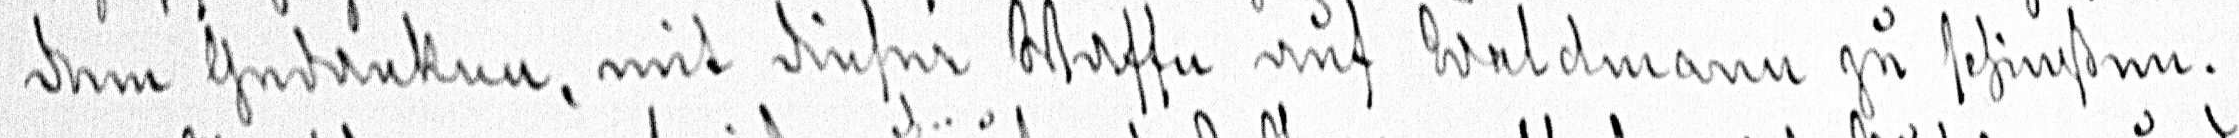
dem Gedanken, mit dieser Waffe auf Waldmann zu schießen.
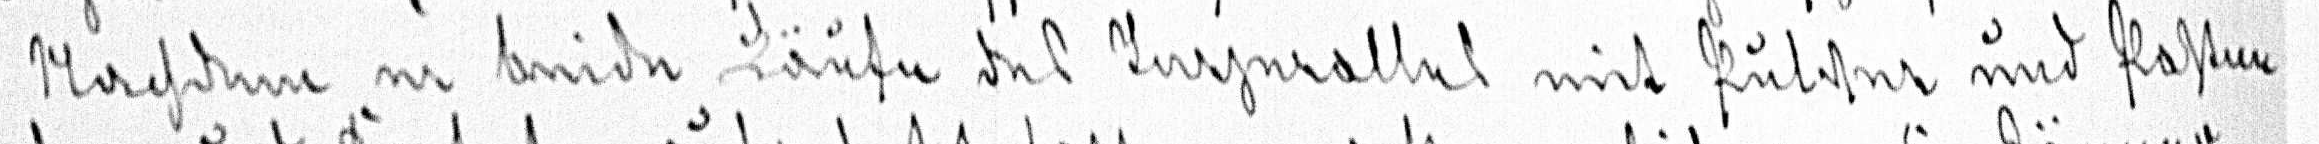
Nachdem er beide Läufe des Terzerolles mit Pulver und Posten
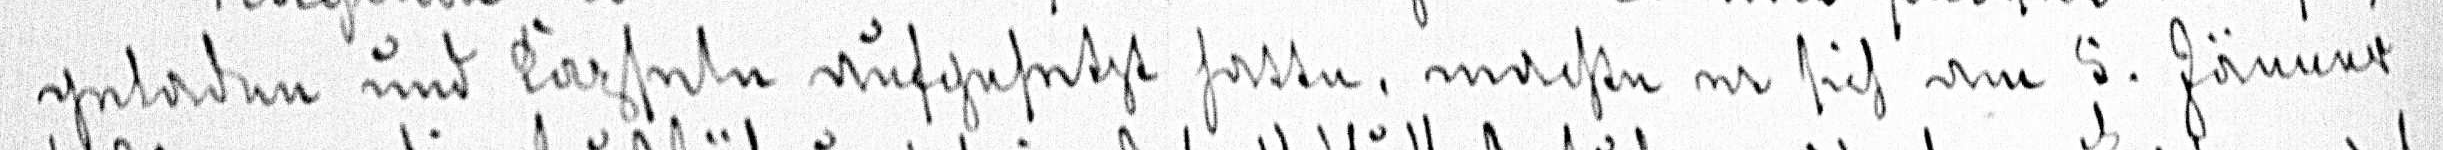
geladen und Kapsele aufgesetzt hatte, machte er sich am 5. Jänner
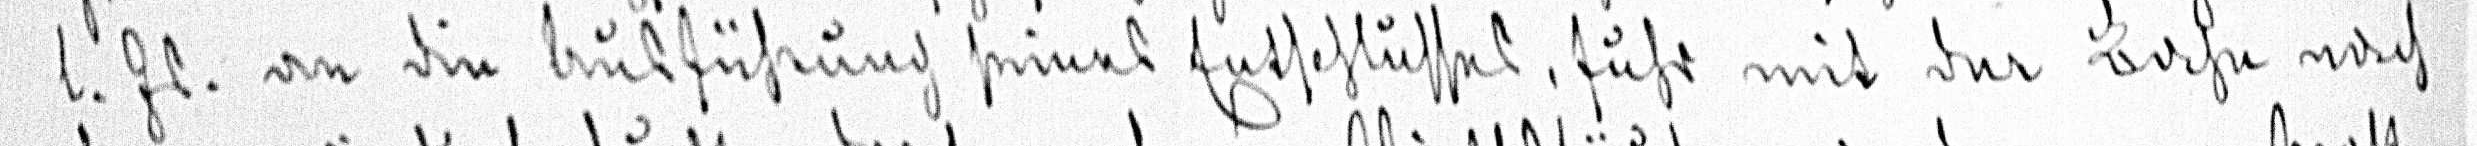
l. Js. an die Ausführung seines Entschlusses, fuhr mit der Bahn nach
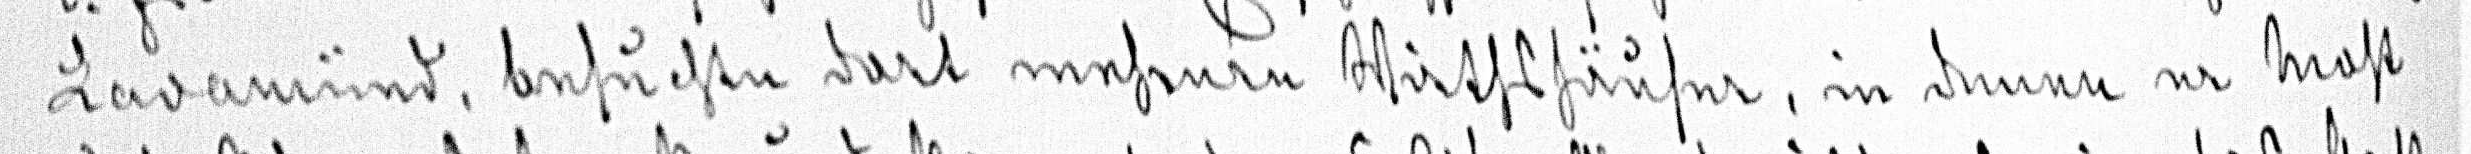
Lavamünd, besuchte dort mehrere Wirtshäuser, in denen er Most
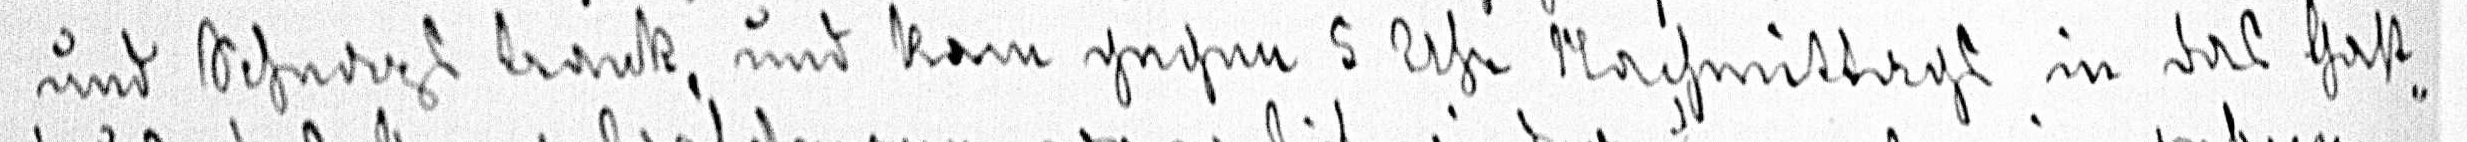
und Schnaps trank, und kam gegen 5 Uhr Nachmittags in das Gast¬
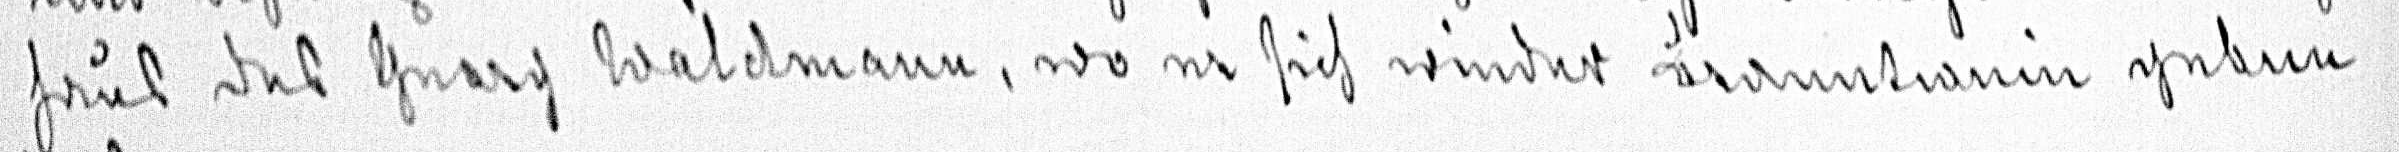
haus des Georg Waldmann, wo er sich wieder Branntwein geben
